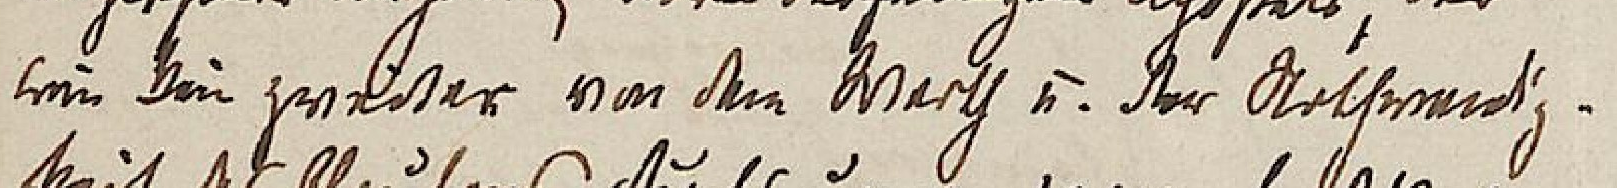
wie kein zweiter von dem Werth u. der Nothwendig¬
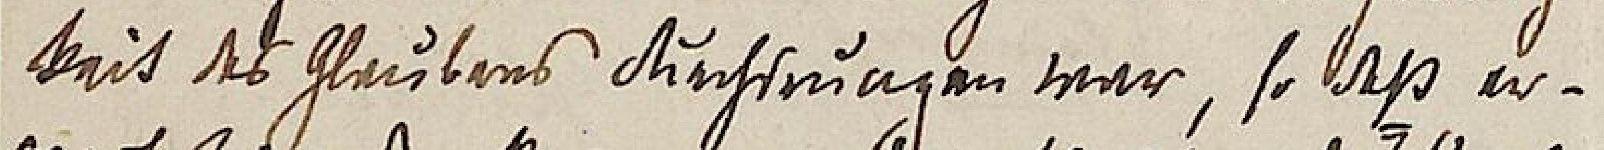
keit des Glaubens durchdrungen war, so daß er¬
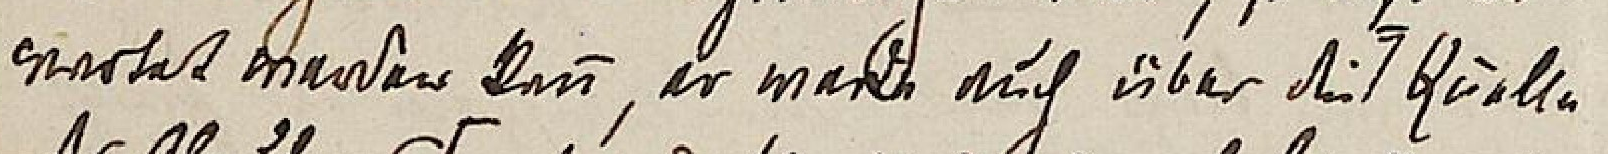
wartet werden kan, er werde auch über die] Quelle
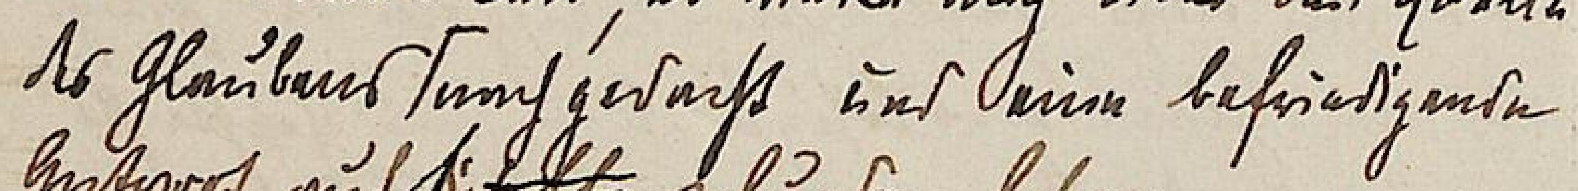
des Glaubens [ nachgedacht und eine befriedigenden
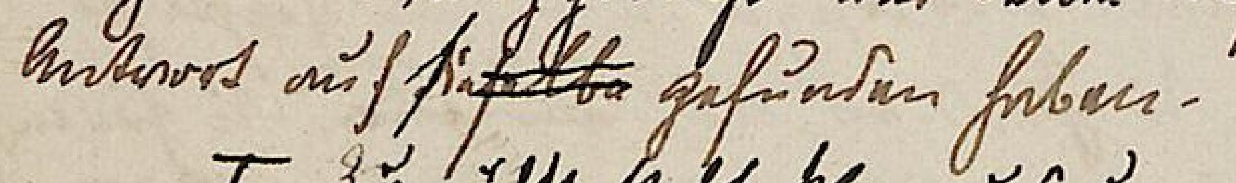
Antwort auf sieselbe gefunden haben.
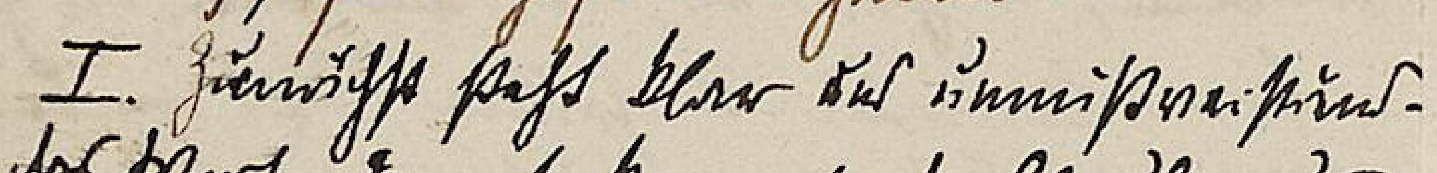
I. Zunächst steht klar und unmißverständ¬
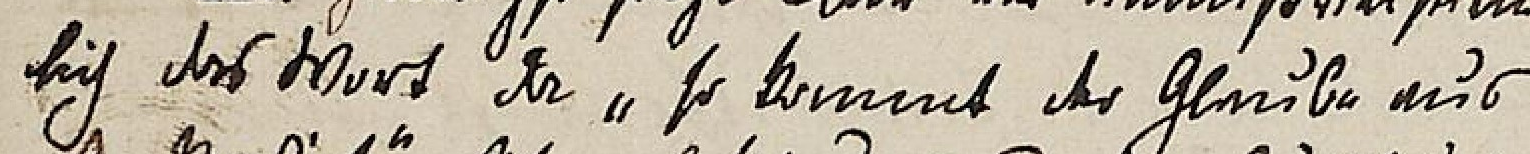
sich das Wort da "so kommt der Glaube aus
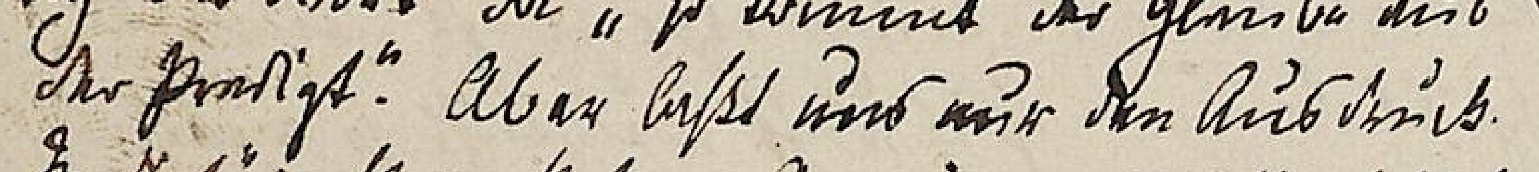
der Predigt." Aber laßt uns nur den Ausdruck
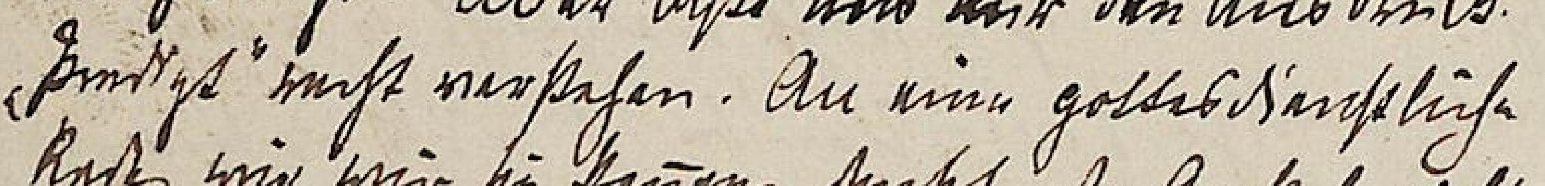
"Predigt" recht verstehen. An eine gottesdienstliche
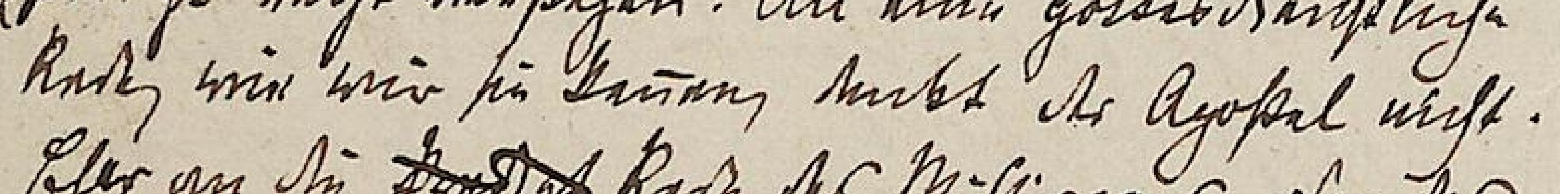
Rede, wie wir sie kenen, denkt der Apostel nicht.
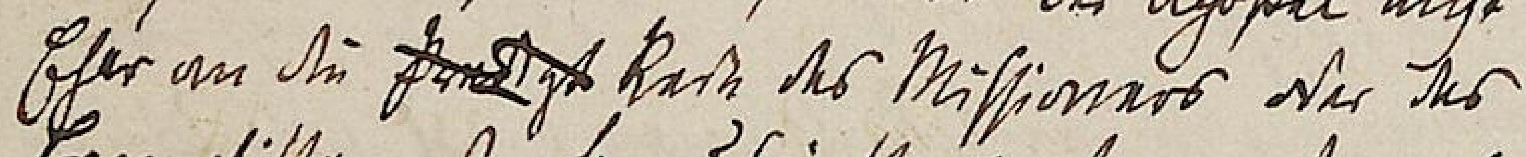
Eher an die Predigt Rede des Missionars oder des
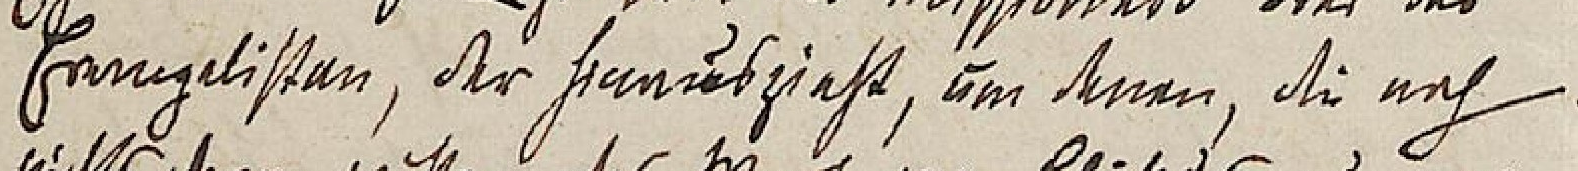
Evangelisten, der hinauszieht, um denen, die noch
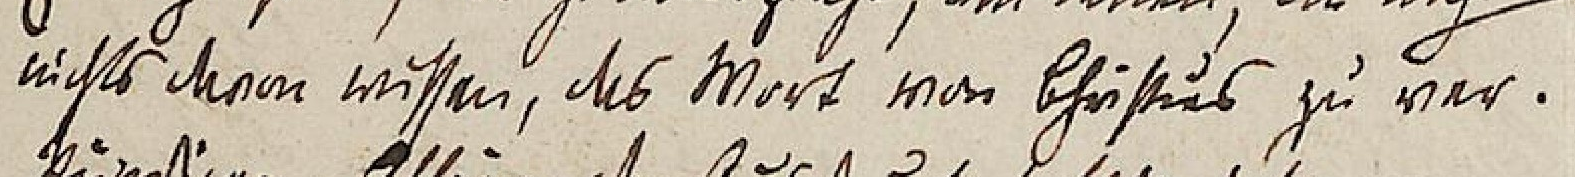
nichts davon wissen, das Wort von Christus zu ver¬
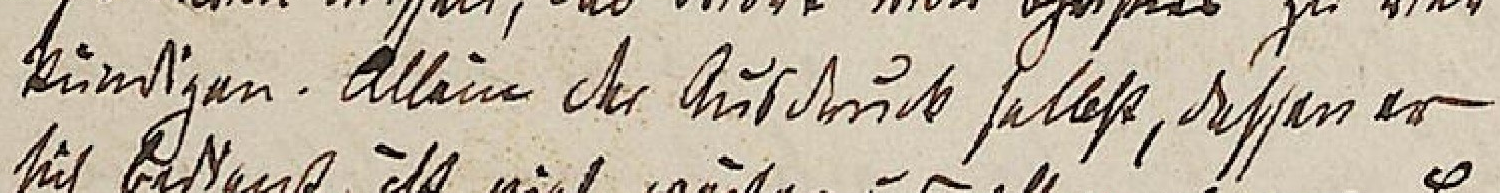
kündigen. Allein der Ausdruck selbst, dessen er
